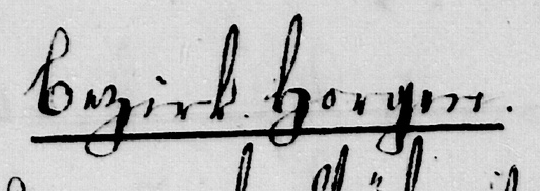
Bezirk Horgen
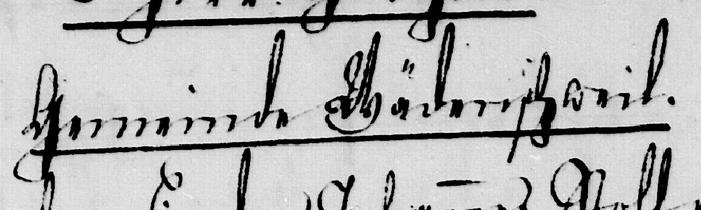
Gemeinde Wädenschweil.
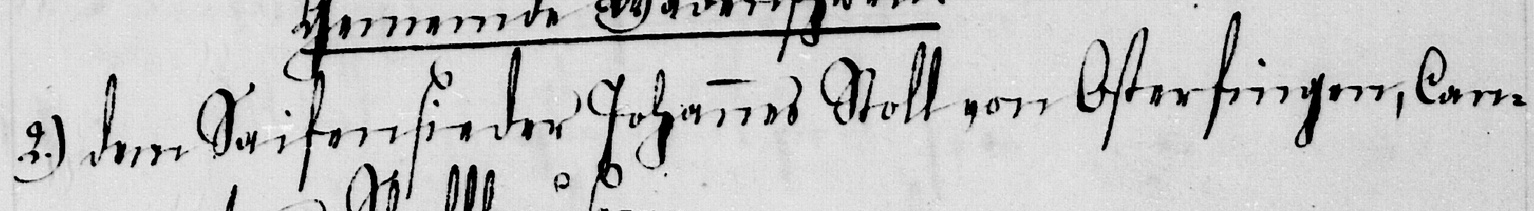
2.) dem Saifensieder Johannes Stoll von Osterfingen, Can¬
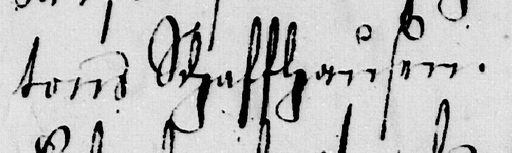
tons Schaffhausen.
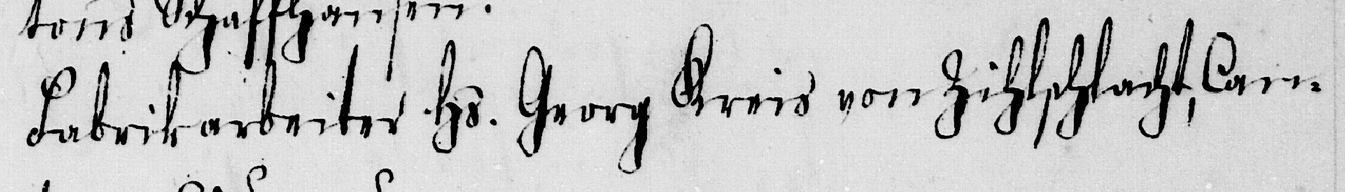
abrikarbeiter Hs. Georg Kreis von Zihlschlacht, Can¬
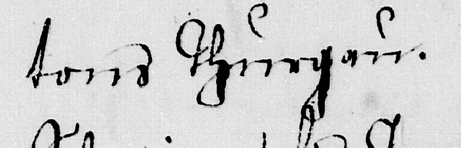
tons Thurgau.
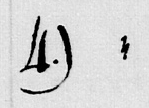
4.)
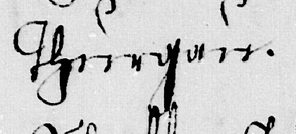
Thurgau.
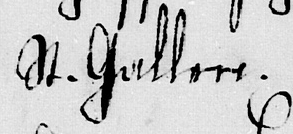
St. Gallen.
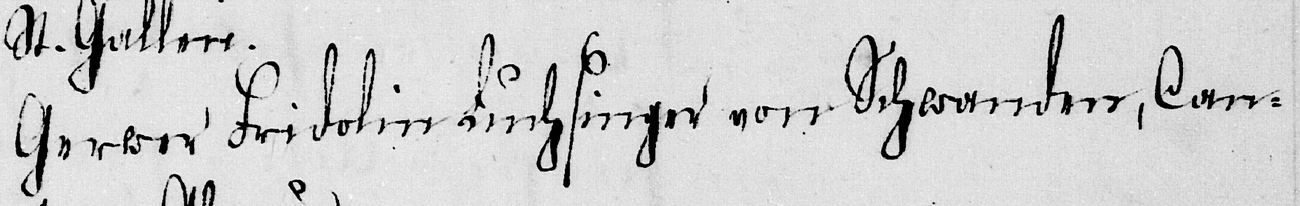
erwer Fridolin Luchsinger von Schwanden, Can¬
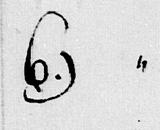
6.)
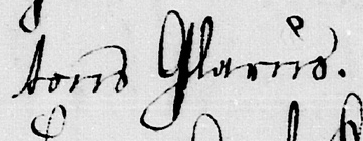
ton Glarus.
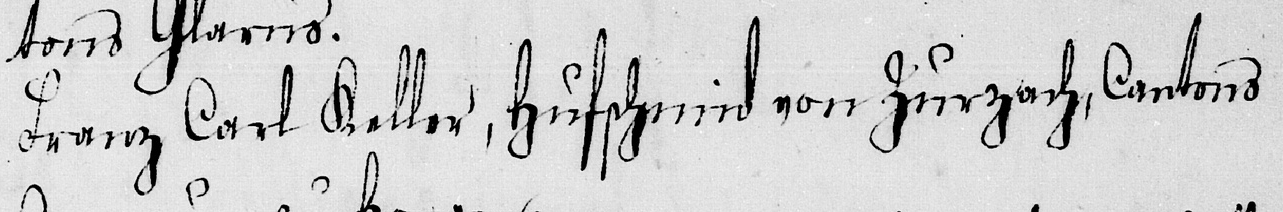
ranz Carl Keller, Hufschmid von Zurzach, Cantons
